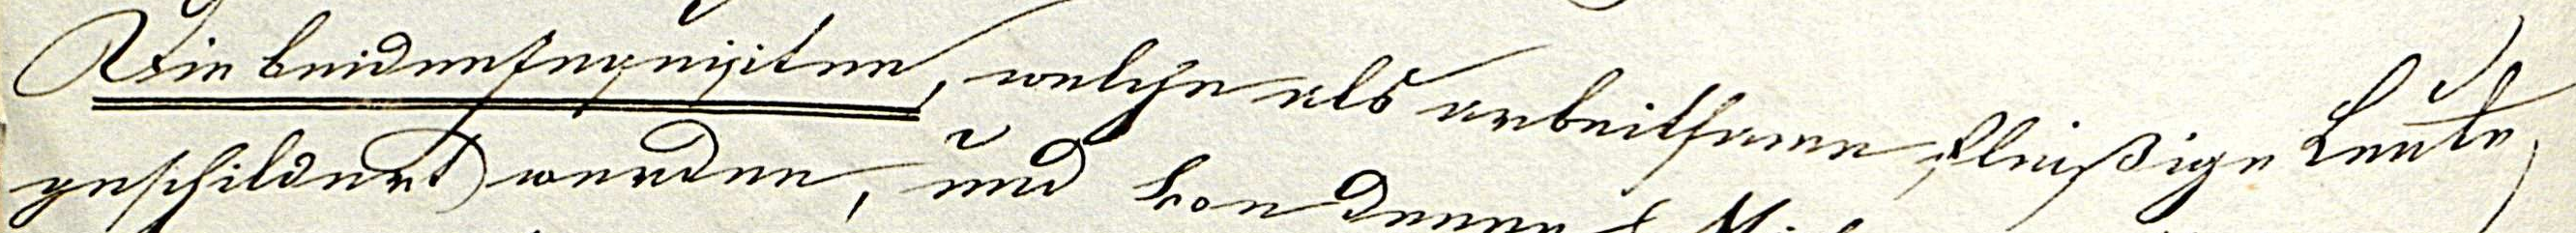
Die beiden Inquisiten, welche als arbeitsame fleißige Leute
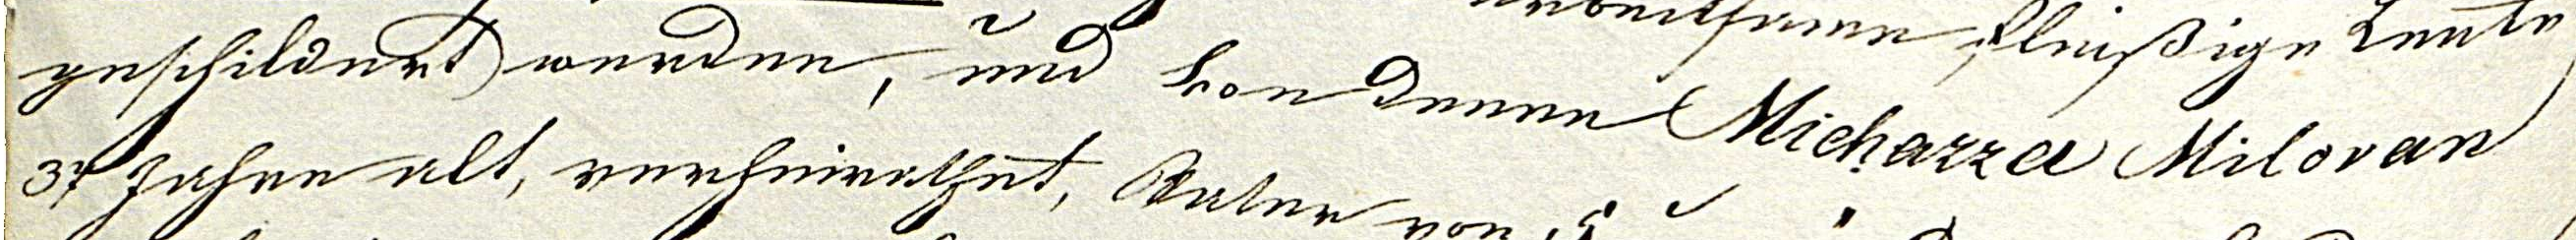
geschildert werden, und von denen Michazza Milovan
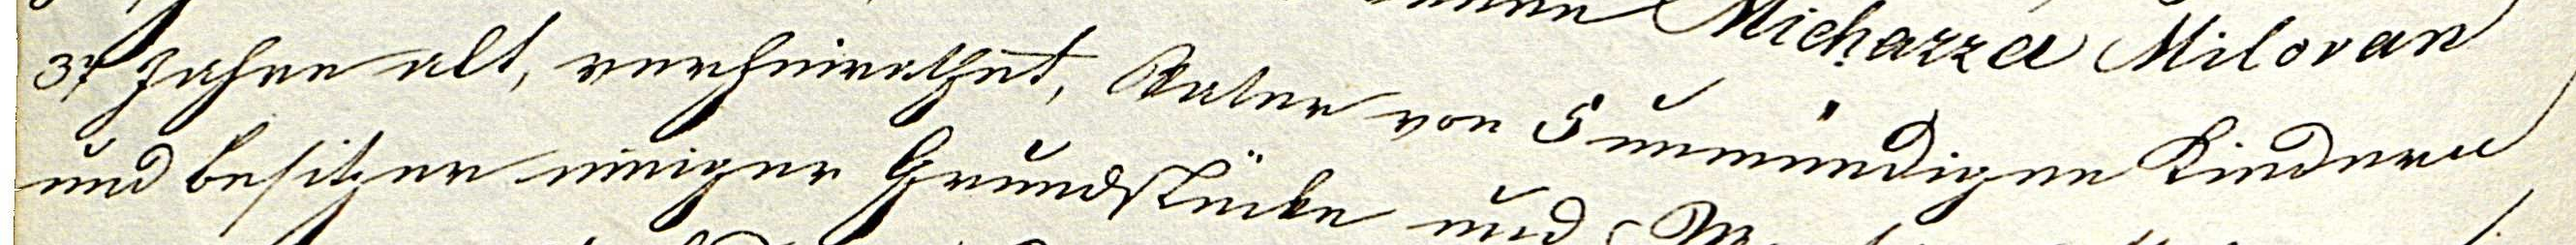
37 Jahre alt, verheirathet, Vater von 5 unmündigen Kindern
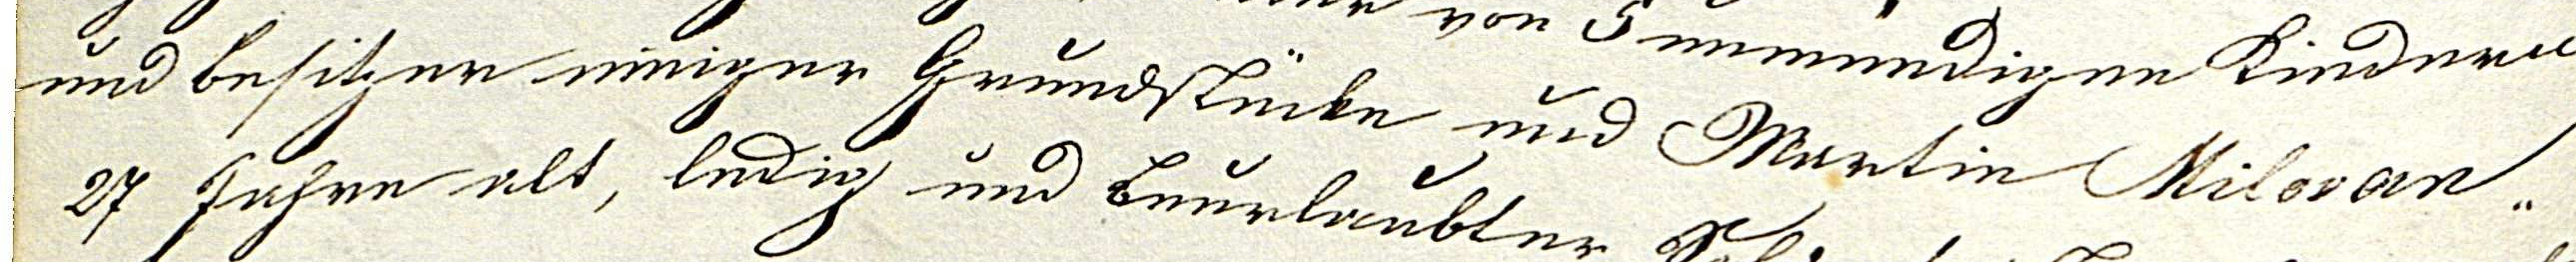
und Besitzer einiger Grundstücke und Martin Milovan
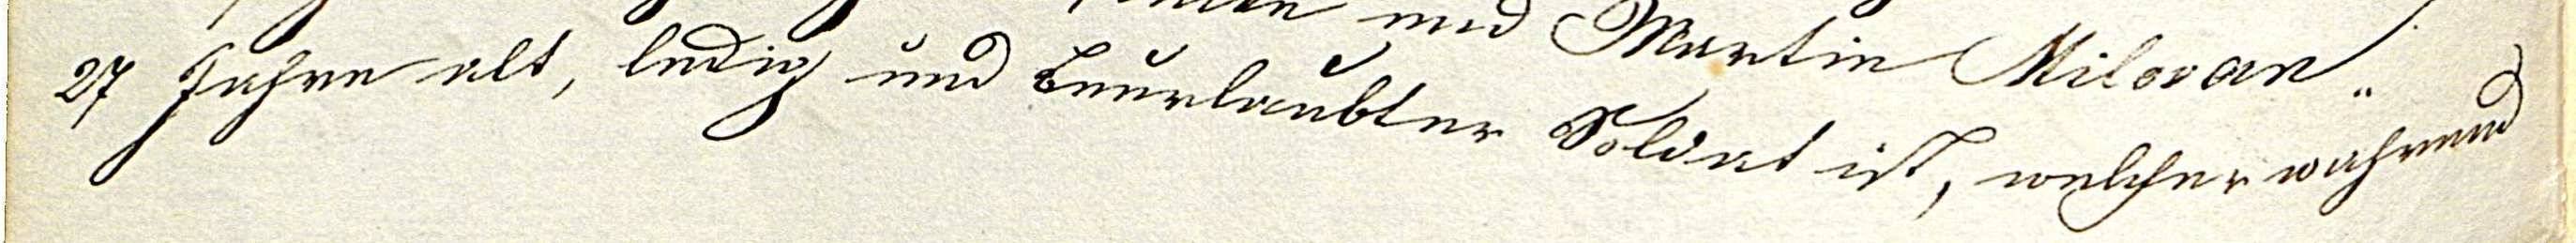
27 Jahre alt, ledig und Beurlaubter Soldat ist, welcher während
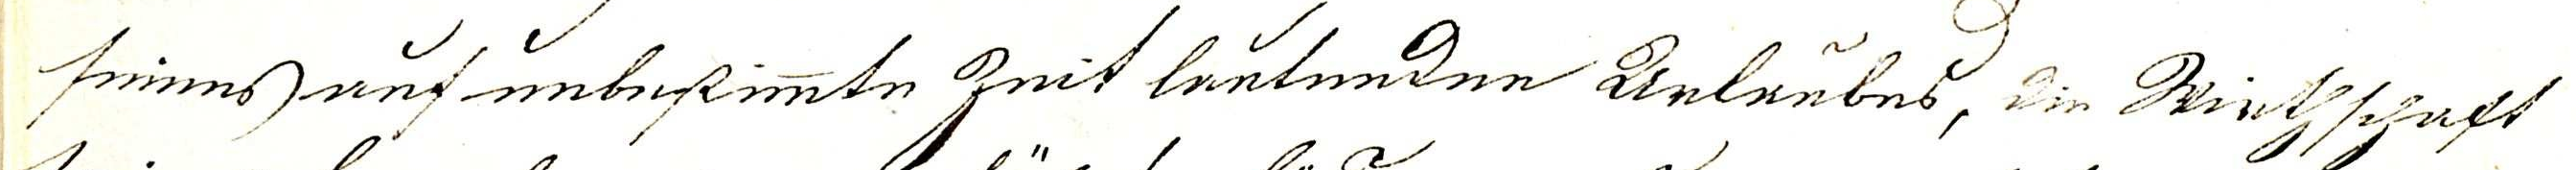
seines auf unbestimmte Zeit lautenden Urlaubes, die Wirthschaft
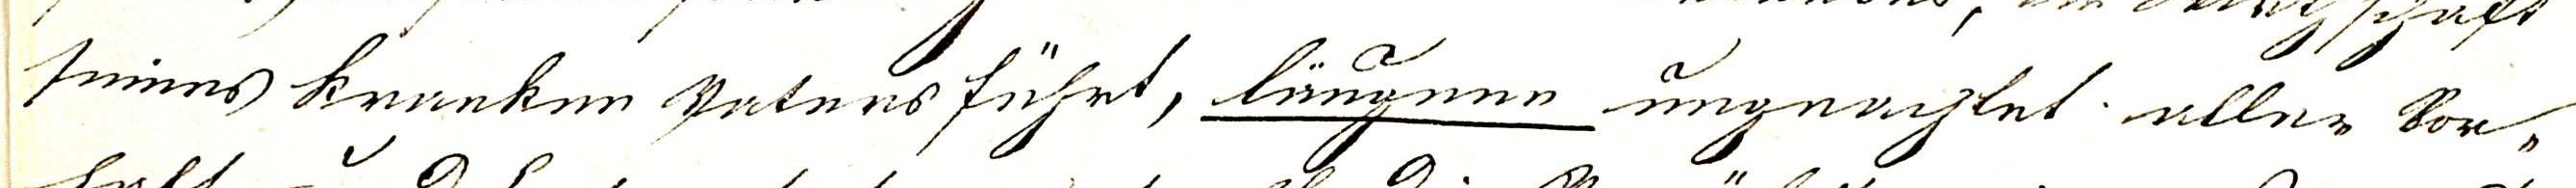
seines kranken Vaters führt, läugnen ungeachtet aller Vor¬
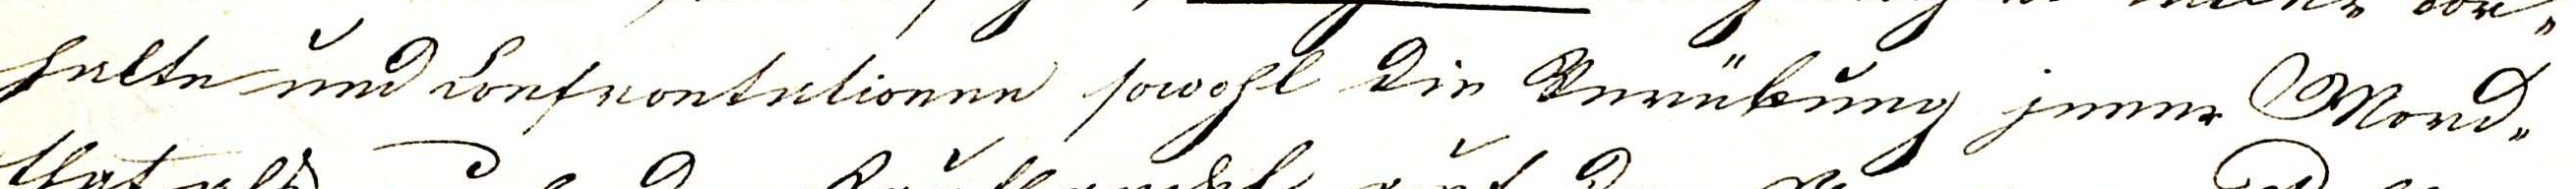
halte und Confrontationen sowohl die Verübung jener Mord¬
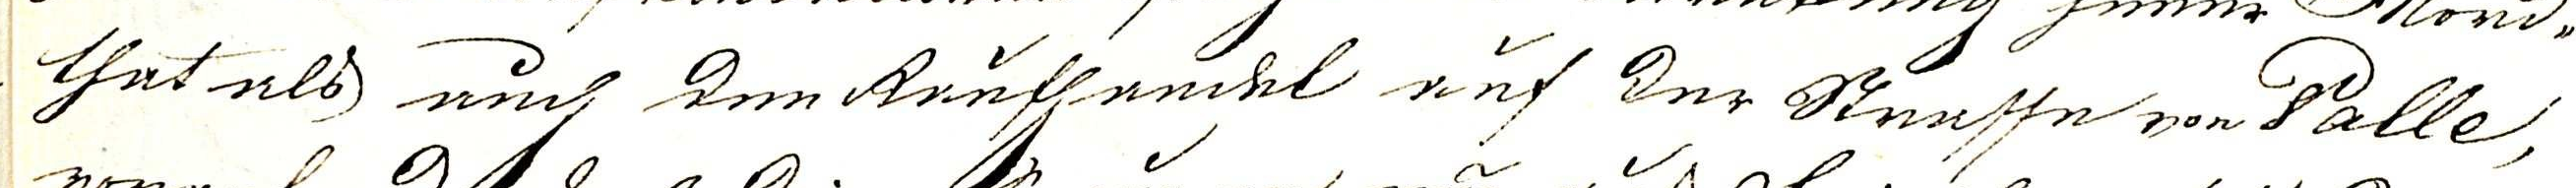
that als auch den Raufhandel auf der Strasse von Valle
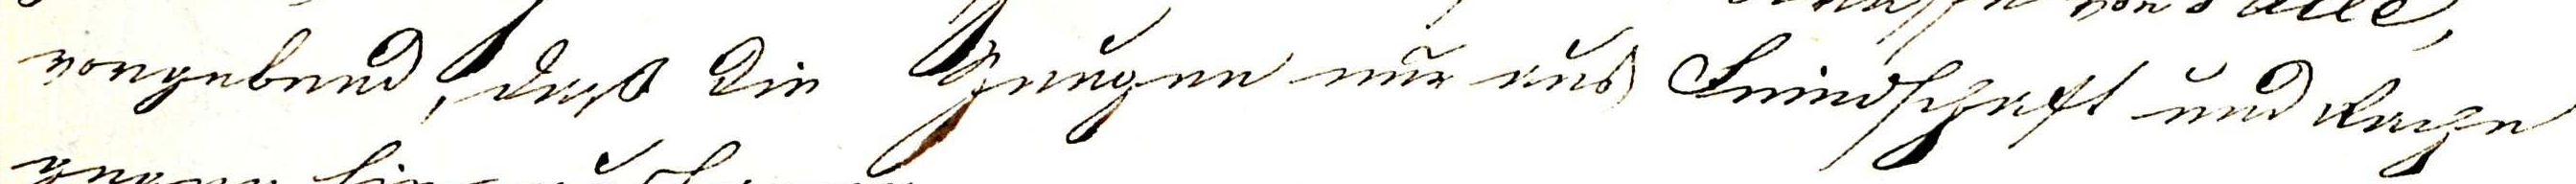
vorgebend, daß die Zeugen nur aus Feidnschaft und Rache
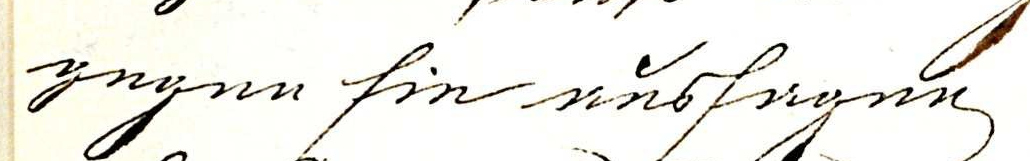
gegen sie aussagen.
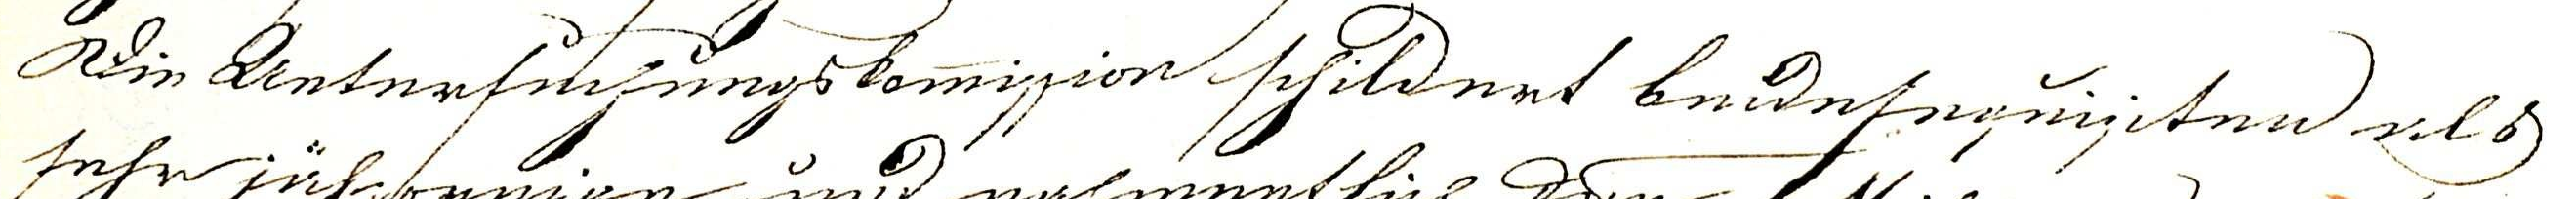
Die Untersuchungskommission schildern beide Inquisiten als
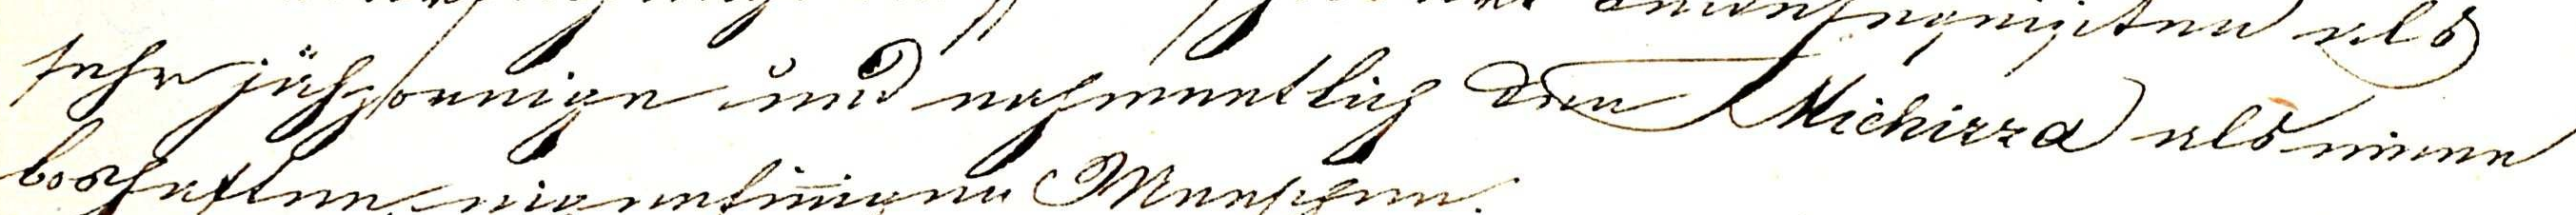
sehr jähzornige und nahmentlich den Michizza als einen
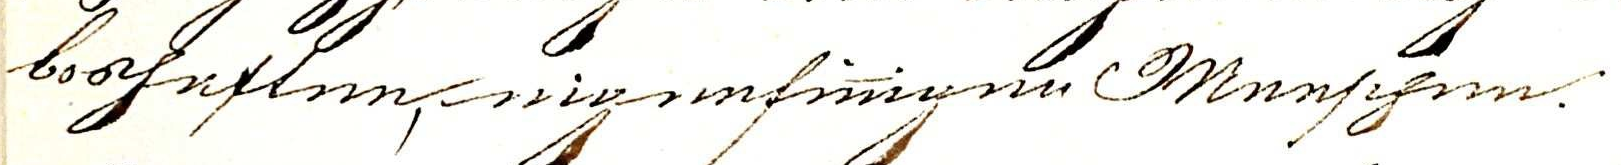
boshaften, eigensinnigen Menschen.
